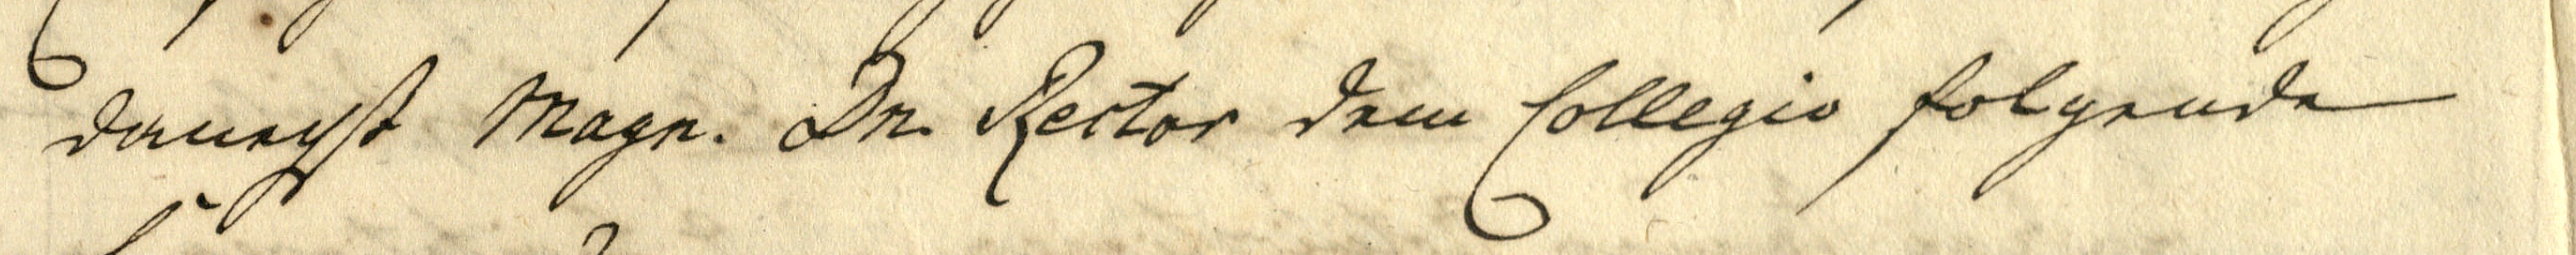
danechst Magn. Dn. Rector dem Collegio folgende
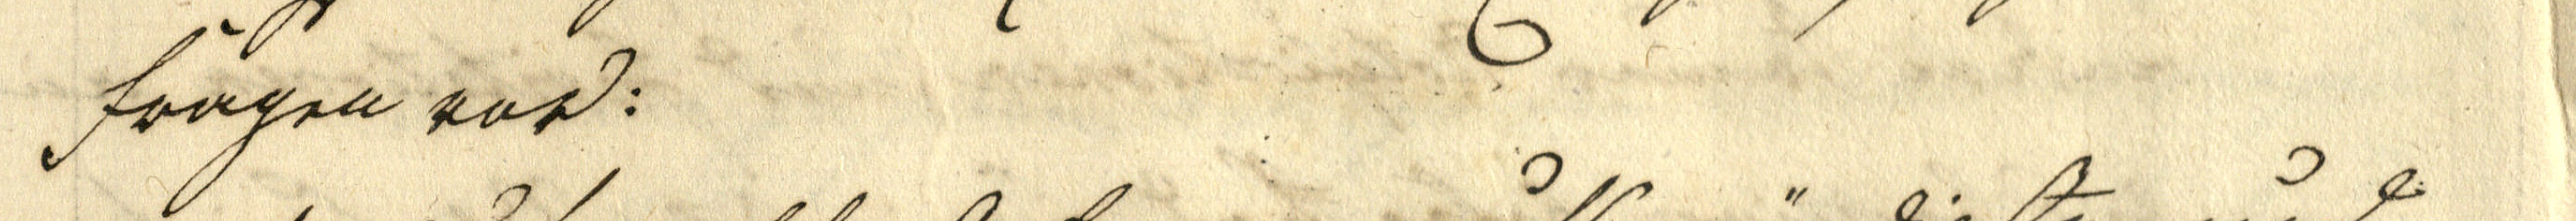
Fragen vor:
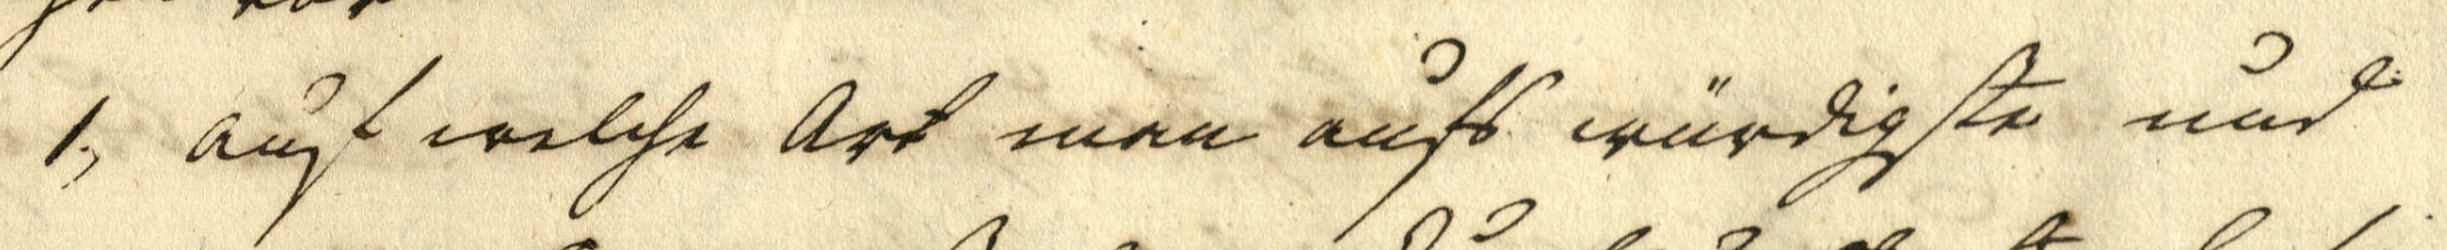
1., auf welche Art man aufs würdigste und
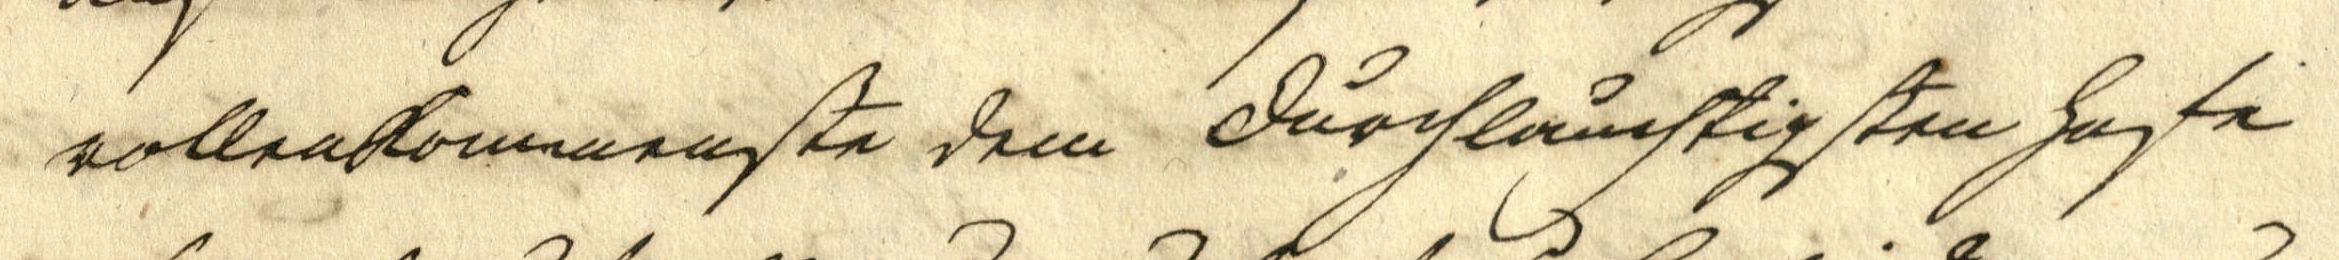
vollenkommenste dem Durchlauchtigsten hofe
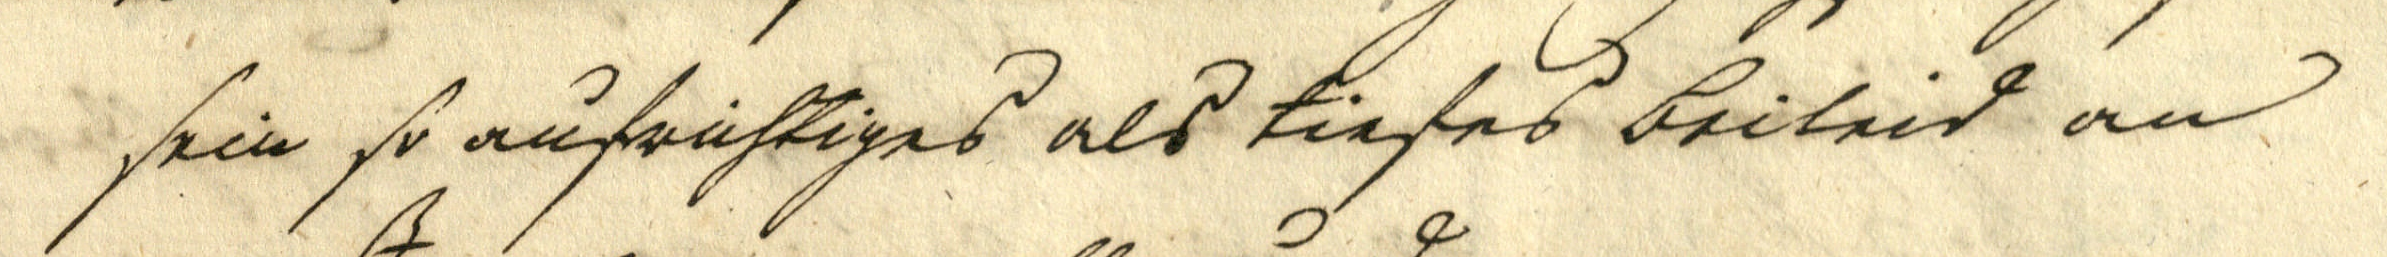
sein so aufrichtiges als tiefes Beileid an
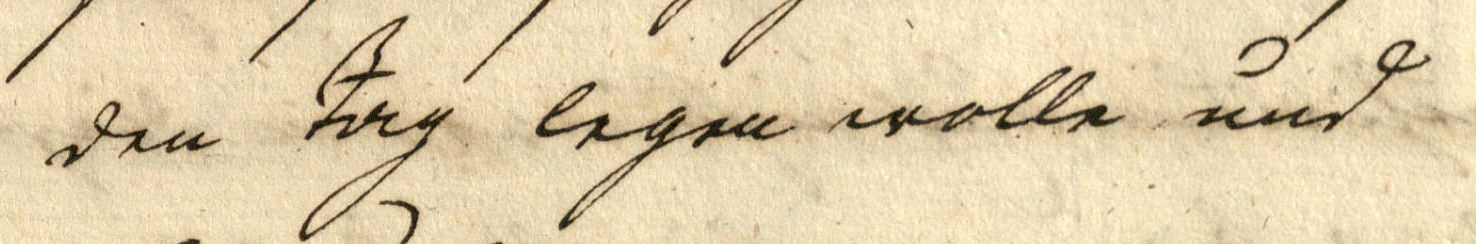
den Tag legen wolle und
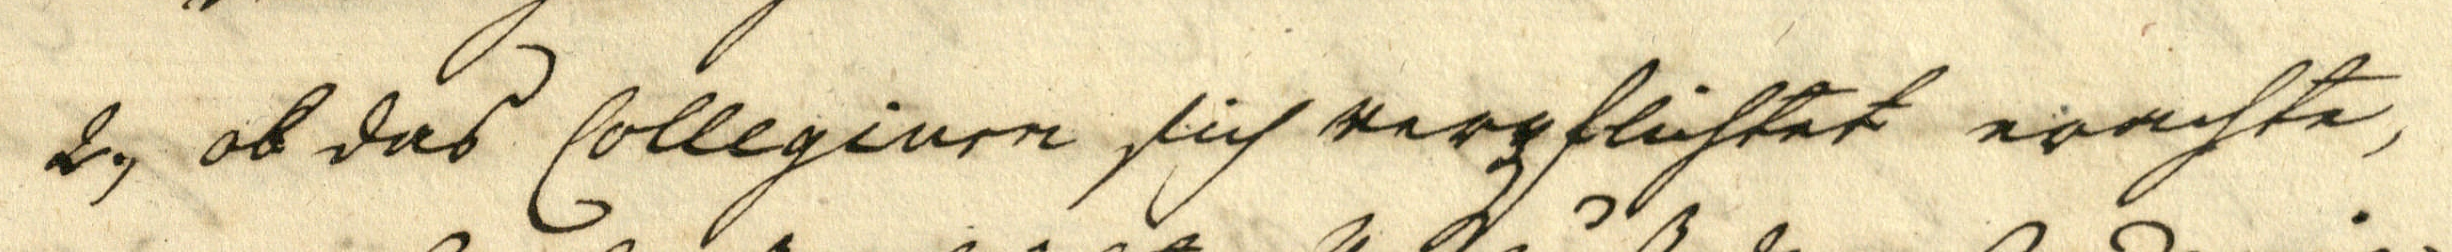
2., ob das Collegium sich verpflichtet erachte,
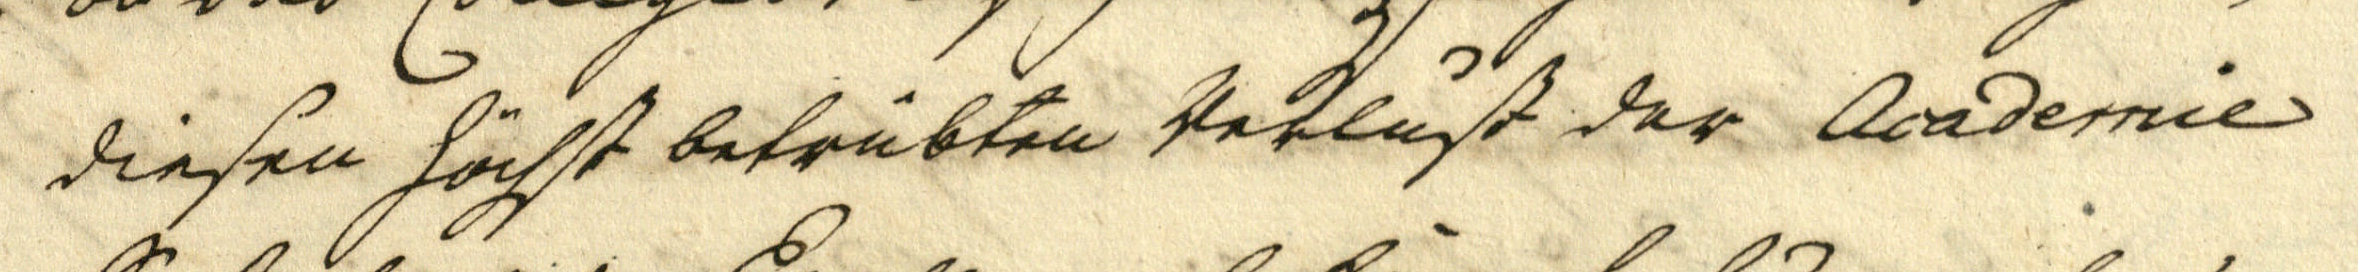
diesen höchst betrübten Verlust der Academie
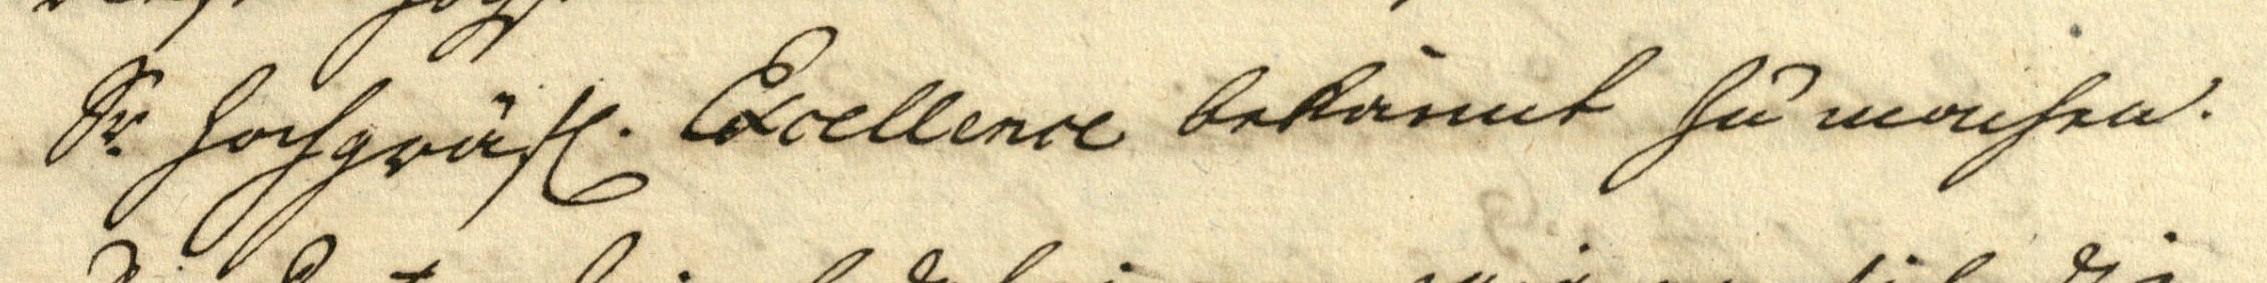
Sr. hochgräfl. Excellence bekannt zu machen.
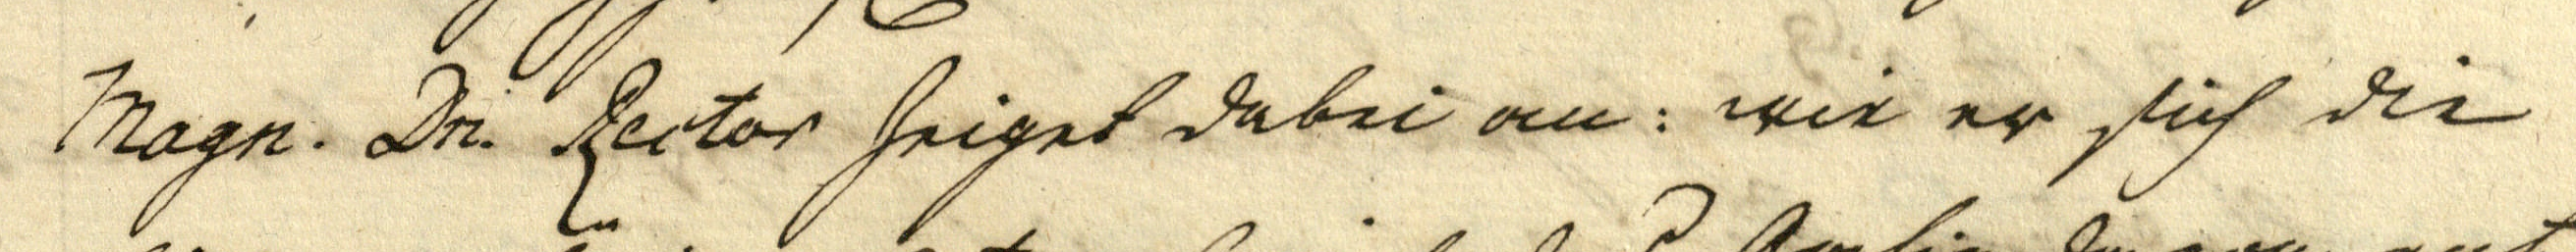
Magn. Dn. Rector zeiget dabei an: wie er sich die
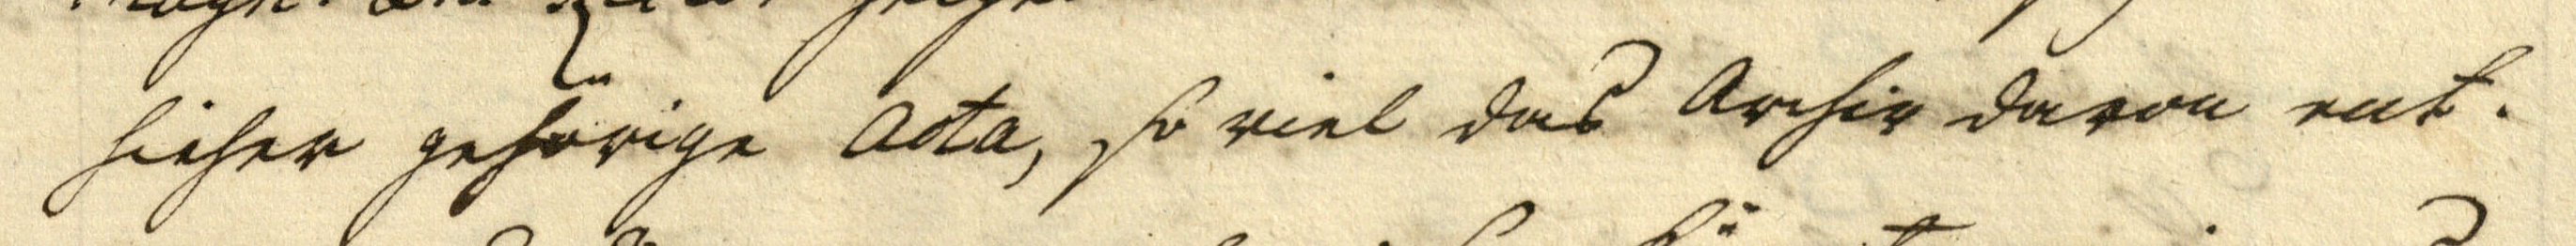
hieher gehörige Acta, so viel das Archiv davon ent-
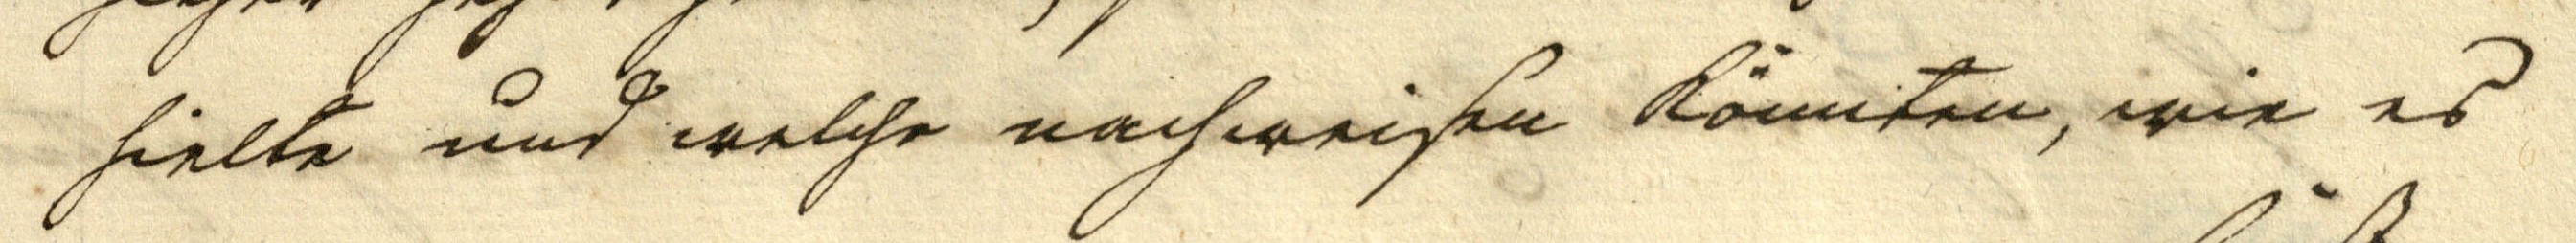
hielte und welche nachweisen könnten, wie es
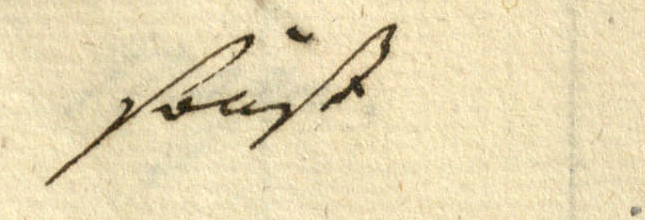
sonst
